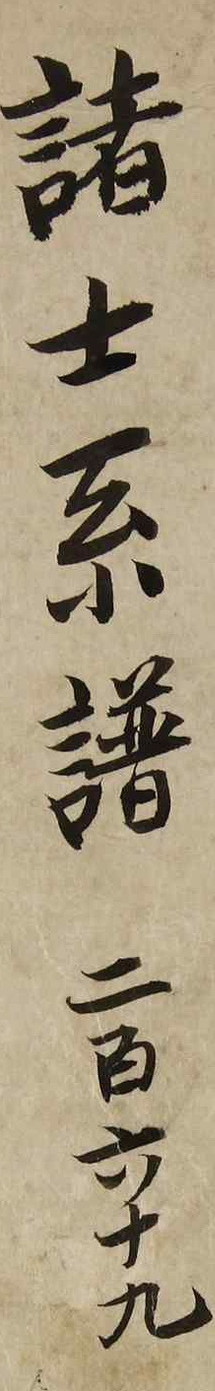諸士系譜二百六十九

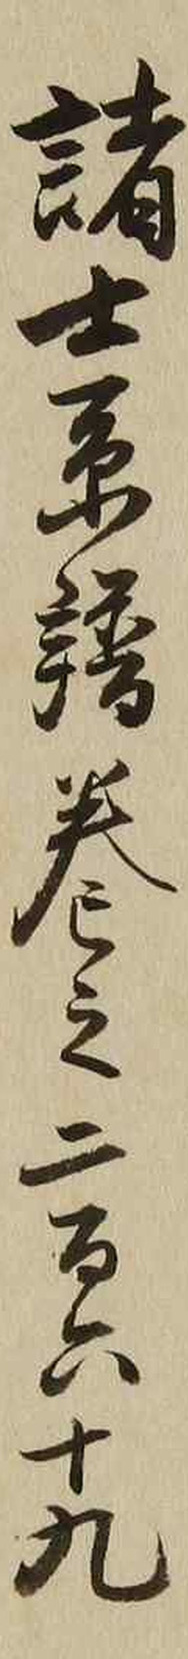諸士系譜巻之六十九六十枚
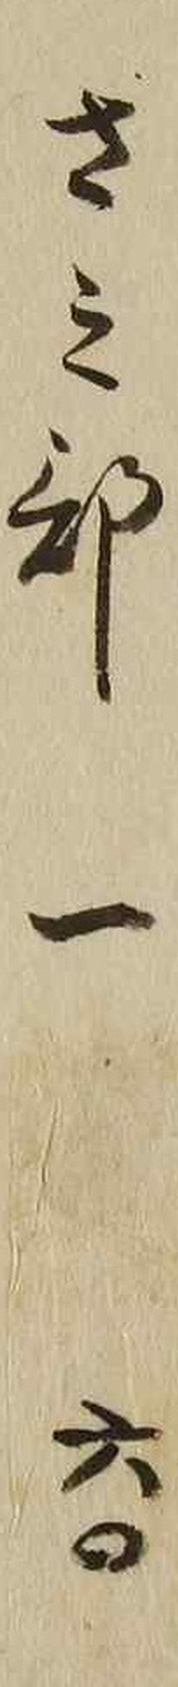さ之部一六〇
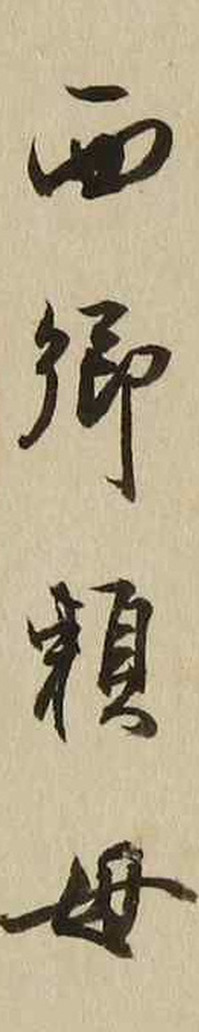西郷賴母

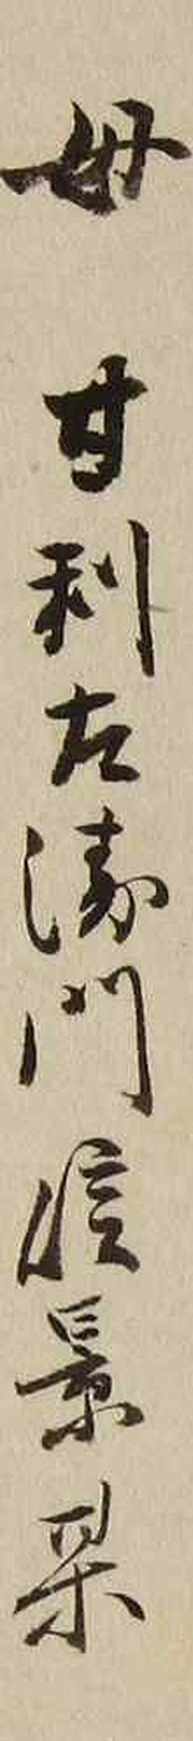母甘利左衛門信景某
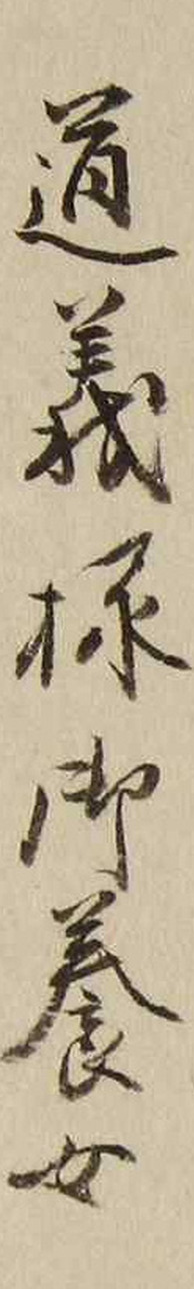道義様御養女

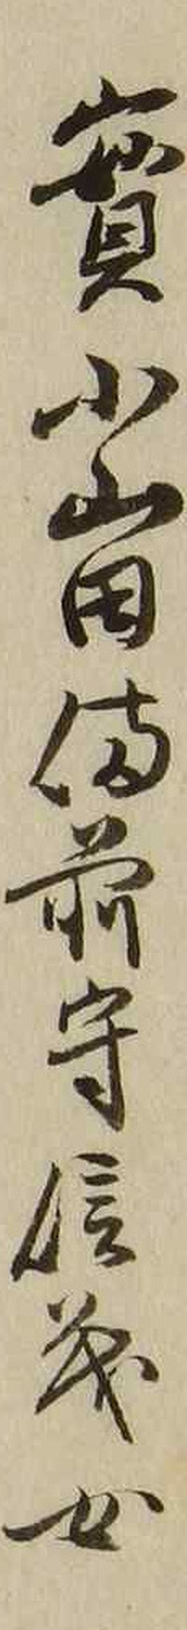実小山田備前守信茂女
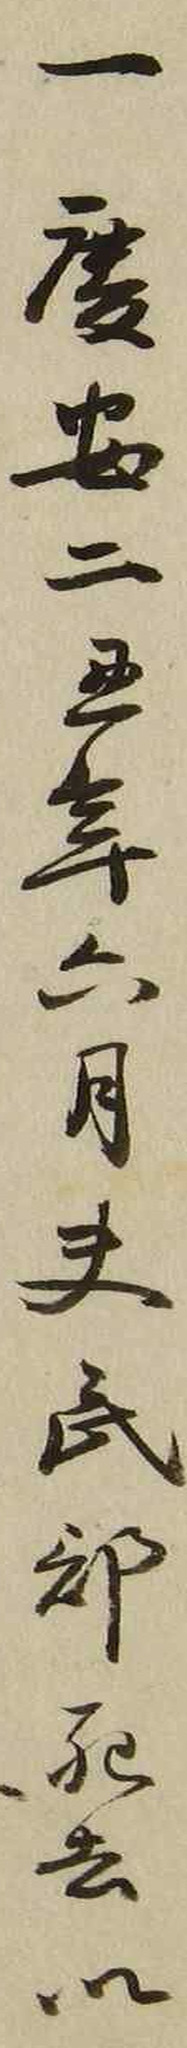一慶安二丑年六月夫民部死去い
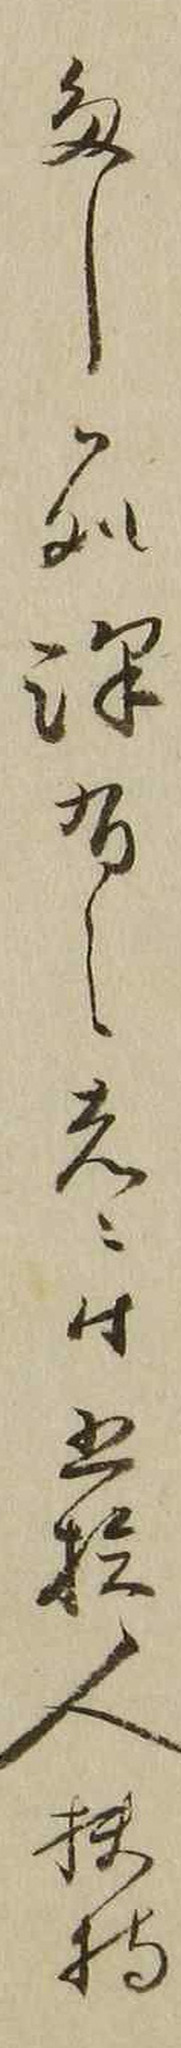たし候処譯有之者に付五拾人扶持
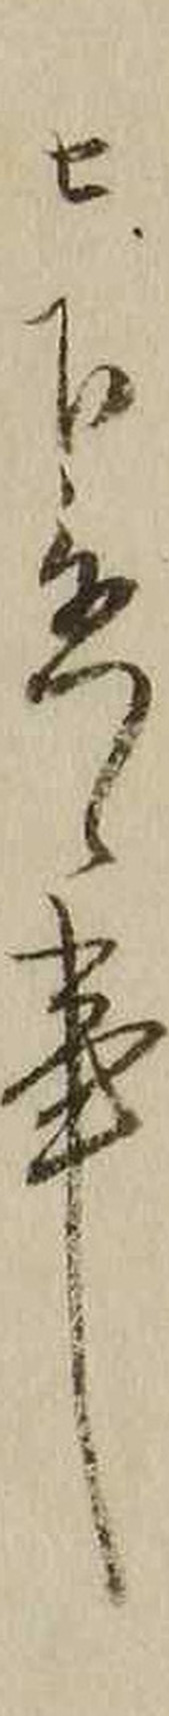被下置候事
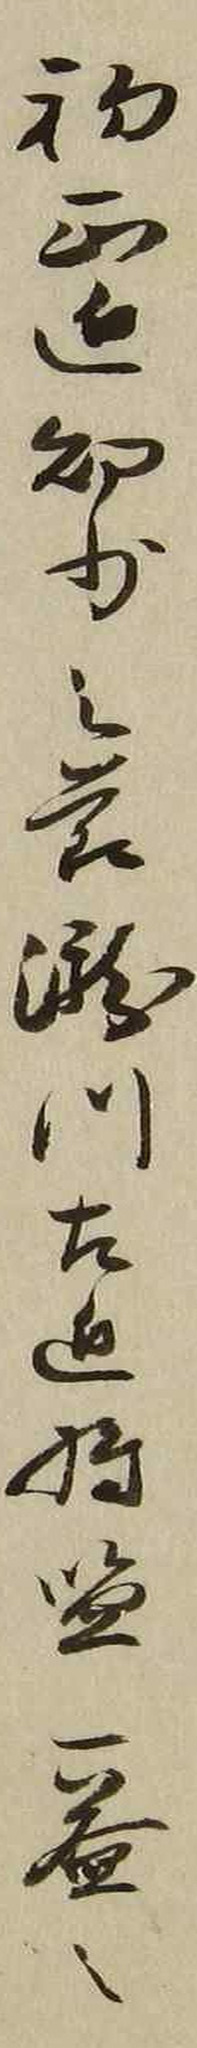初正近幼少之節瀧川左近将監一益之
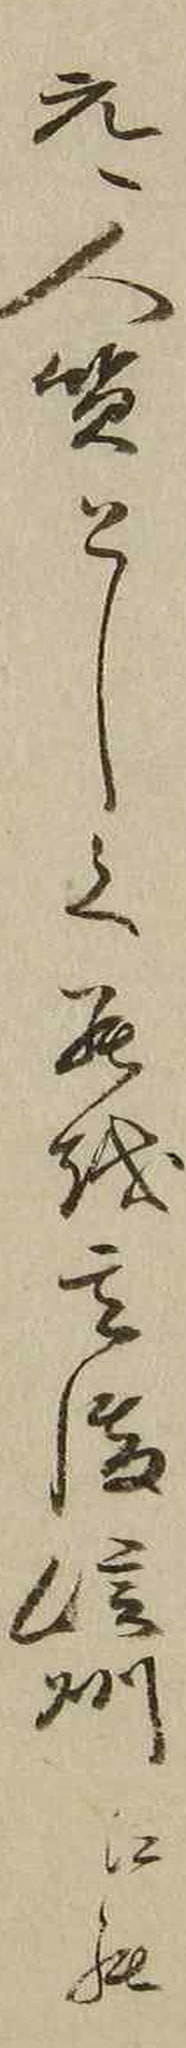元へ人質として罷越其後信州江罷
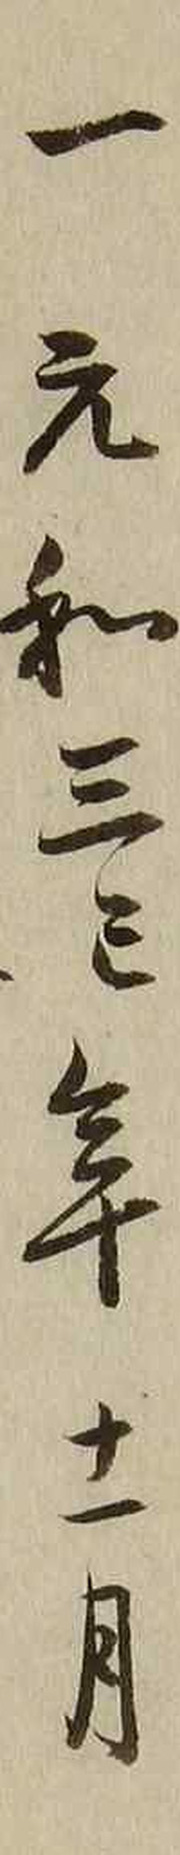一元和三巳年十一月
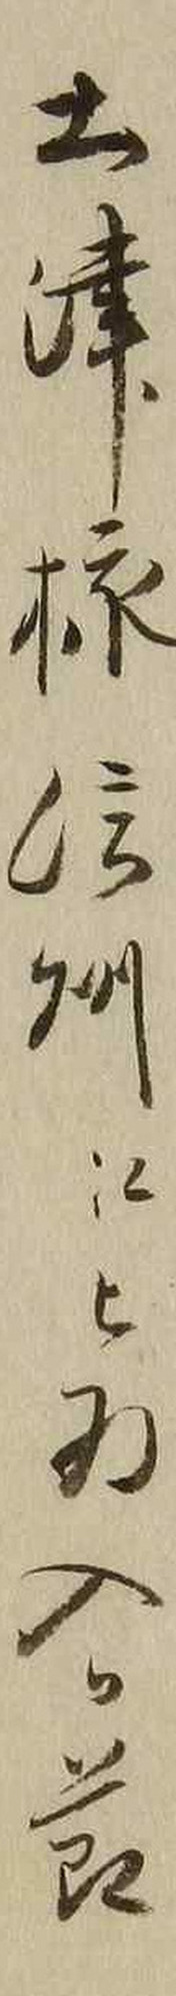土津様信州江被為入候節
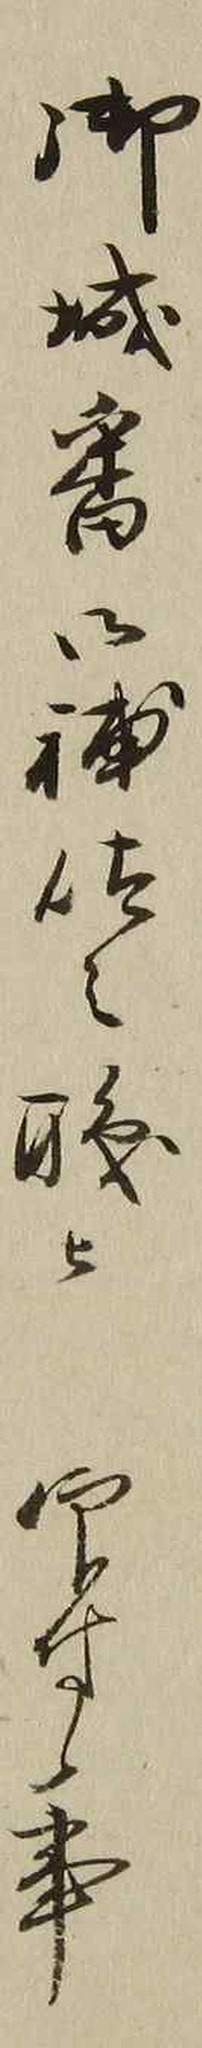御城番御補佐之職被仰付候事
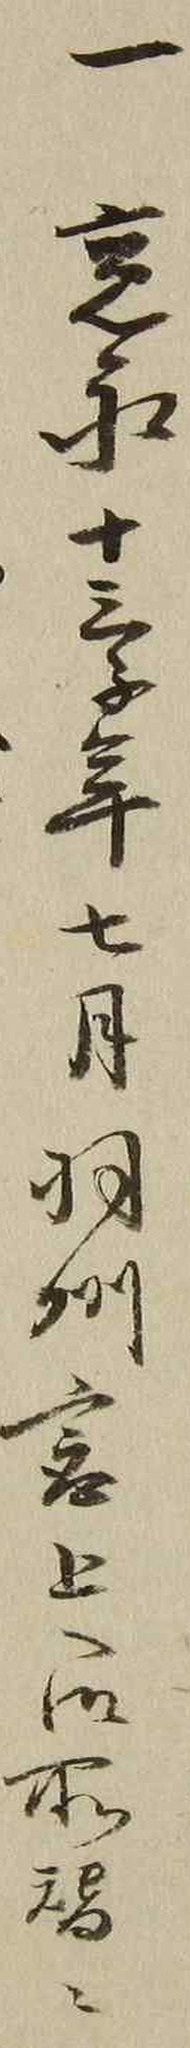一寛永十三子年七月羽州最上へ御所替に
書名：諸士系譜　巻之269　さ之部1
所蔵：会津若松市立会津図書館
